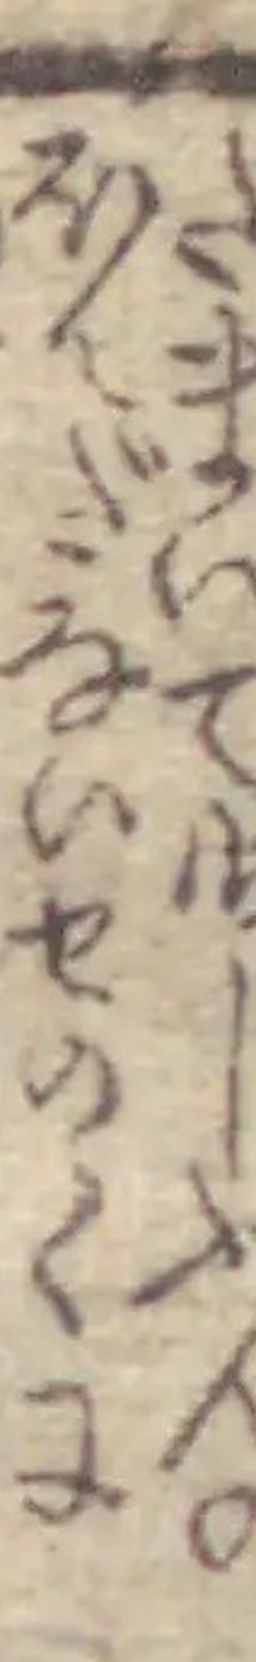ほんだないせのくに
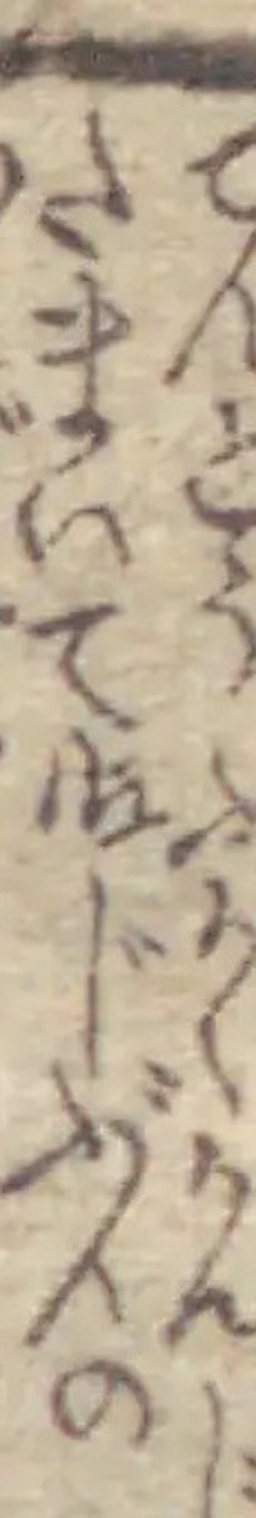たまいて御じぶんの
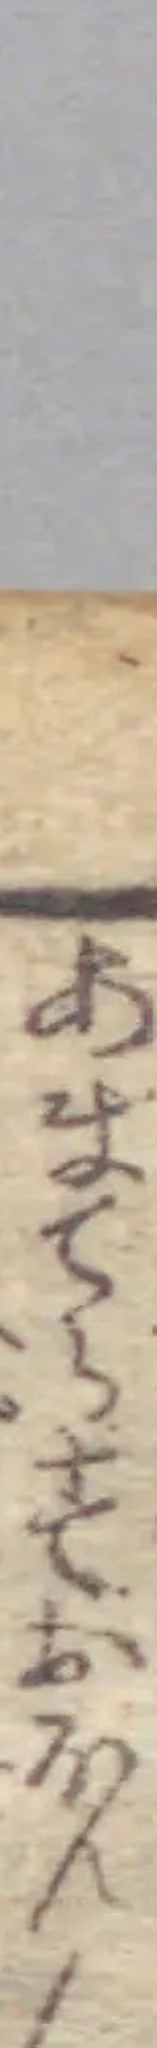あまてらすおほん
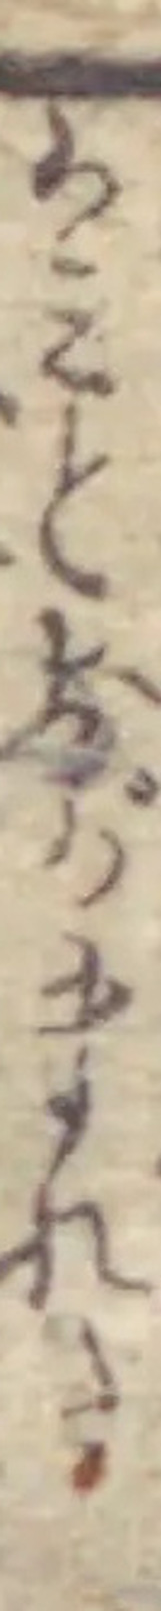かみとおがまれた
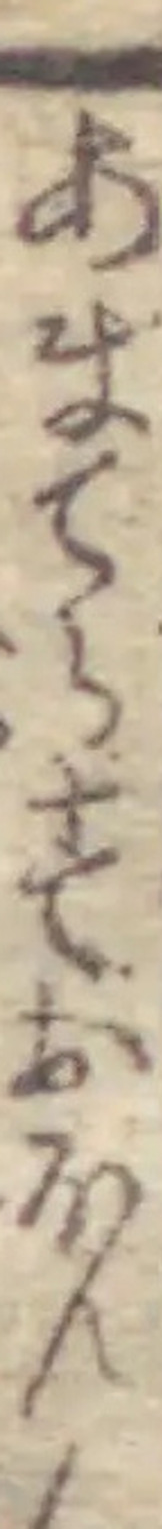あまてらすおほん
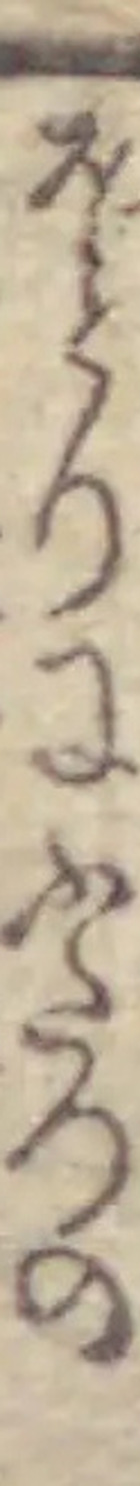ほとりにふたつの
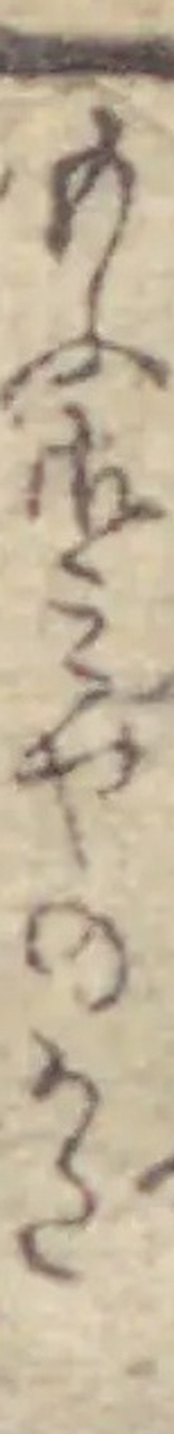もふ御みやのかた
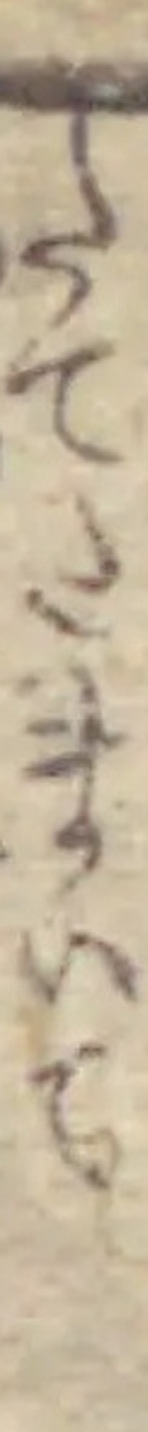たてたまいて
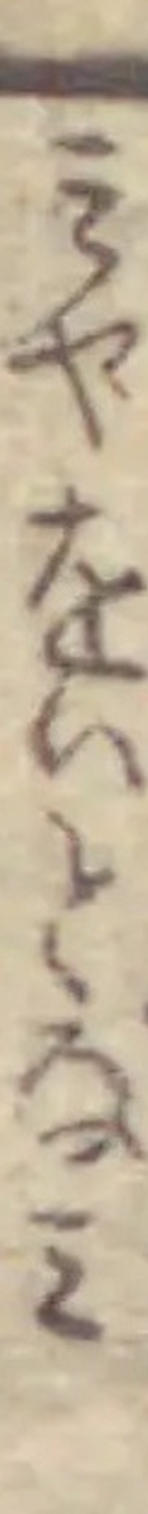みやをいとなみ
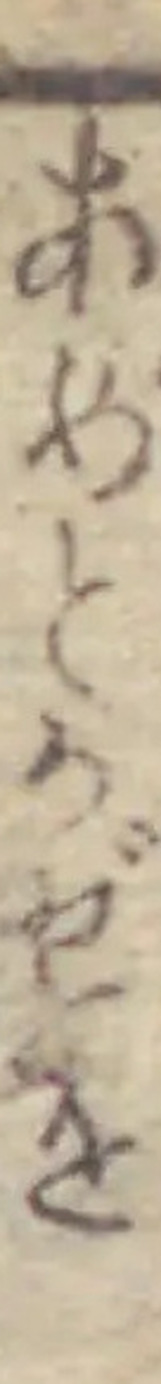あめとかぜを
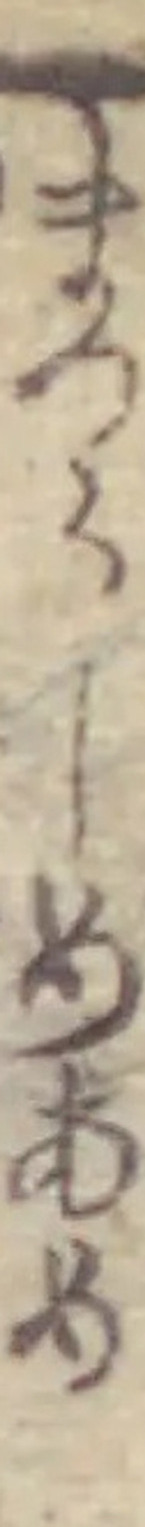まつらしめあめ
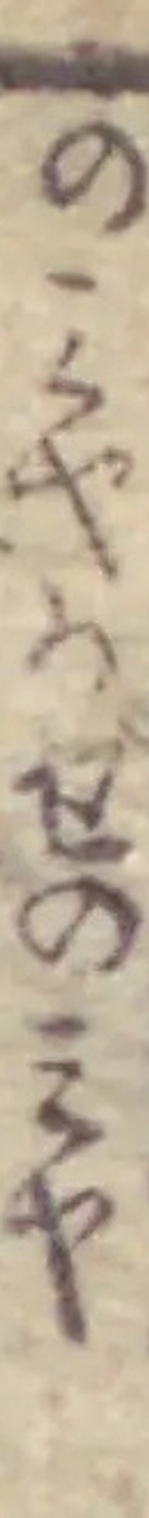のみやかぜのみや
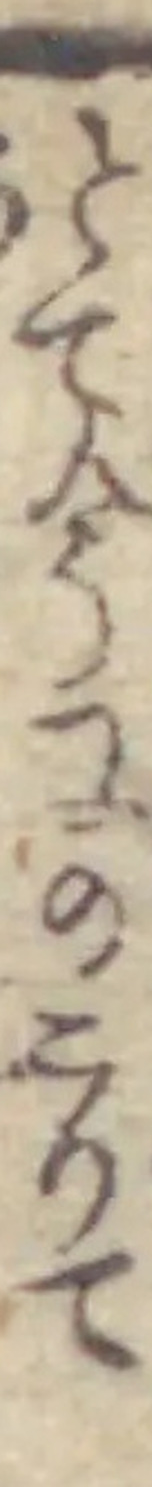とて今にのこりて
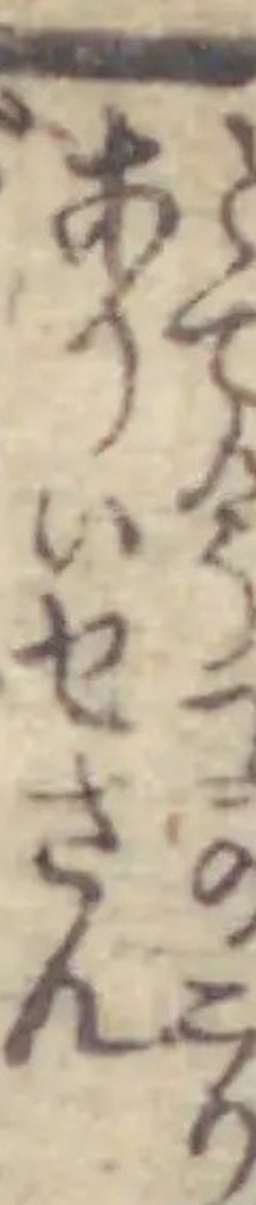ありいせさん
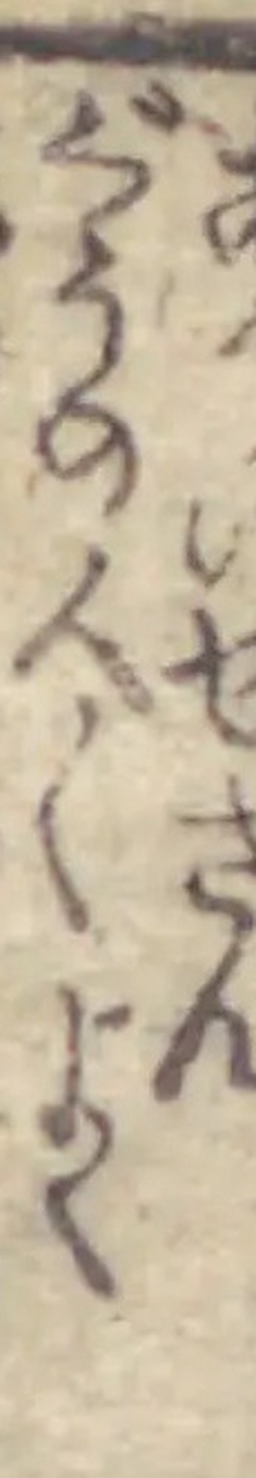ぐうの人々よく
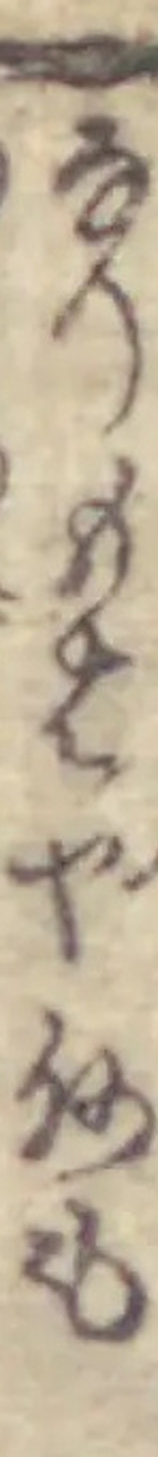なりもはや何も
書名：雨宮風宮出儘略縁記 3巻
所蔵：国立国会図書館 National Diet Library, JAPAN
